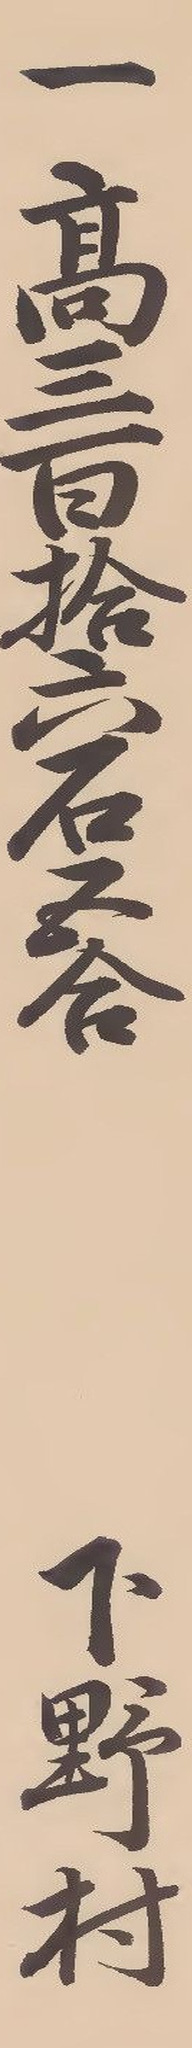一高三百拾六石五合下野村
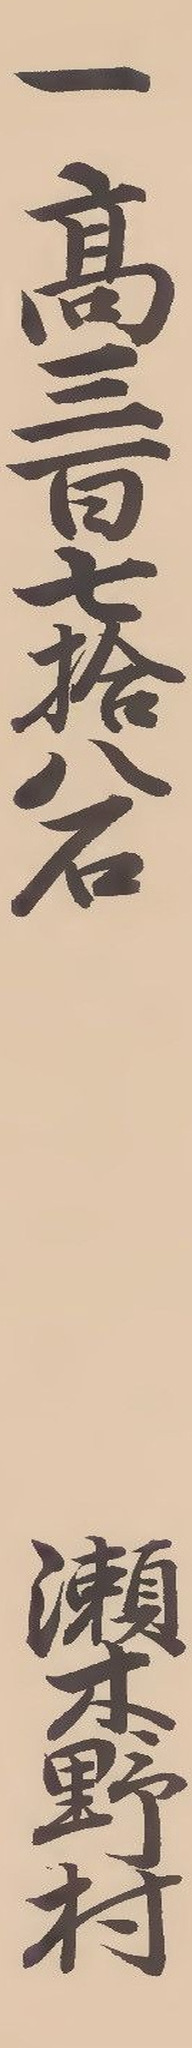一高三百七拾八石瀬木野村
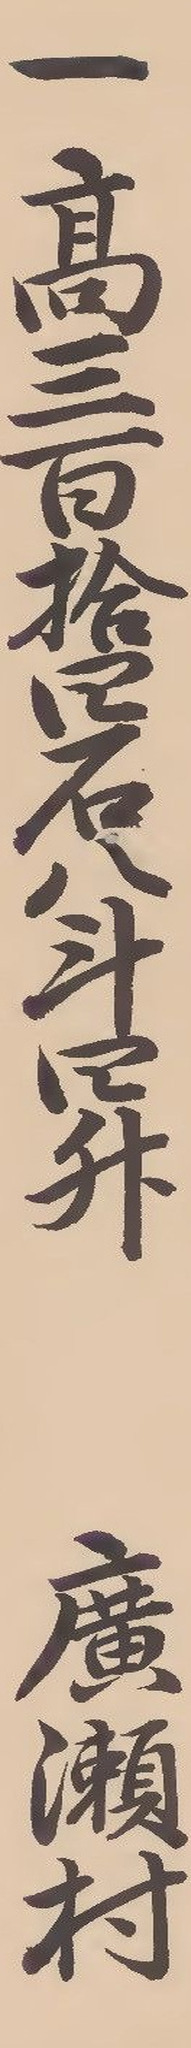一高三百拾四石八斗四升広瀬村

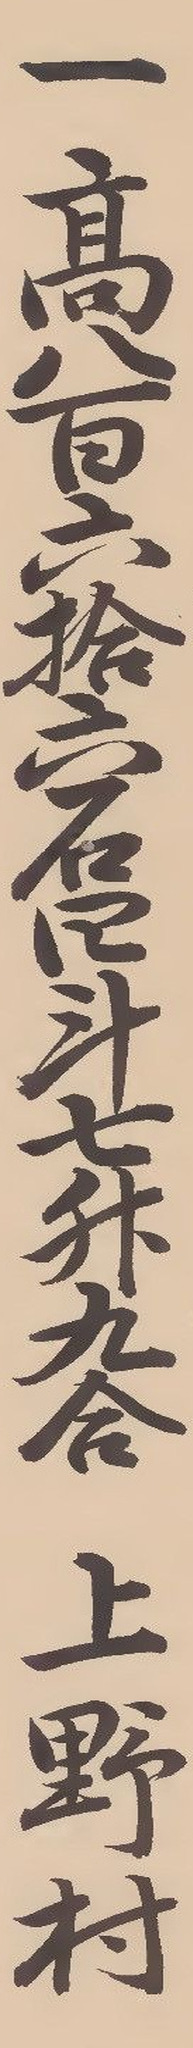一高八百六拾六石四斗七升九合上野村
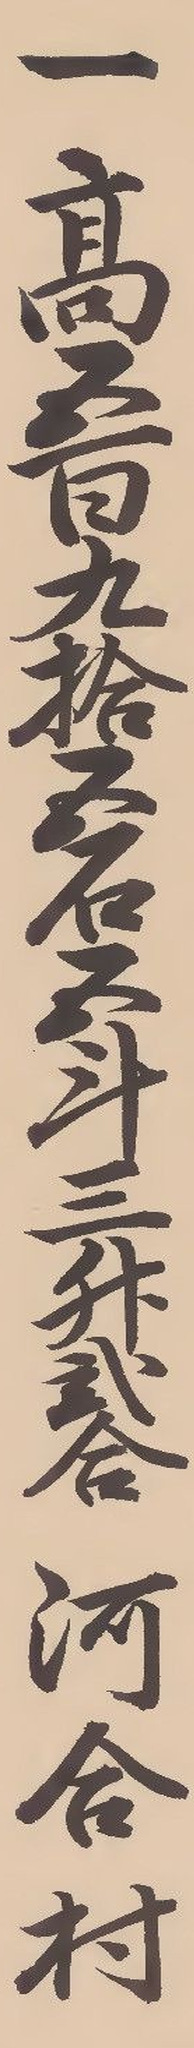一高五百九拾五石五斗三升弐合河合村
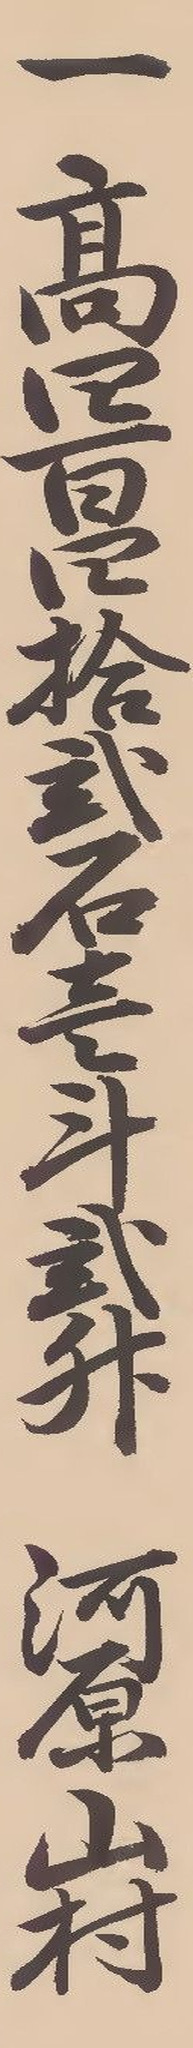一高四百四拾弐石壱斗弐升河原山村
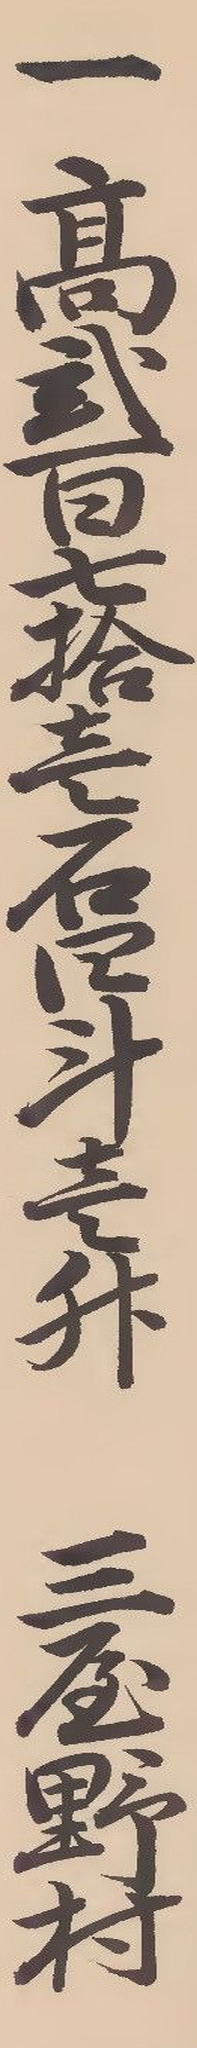一高弐百七拾壱石四斗壱升三屋野村
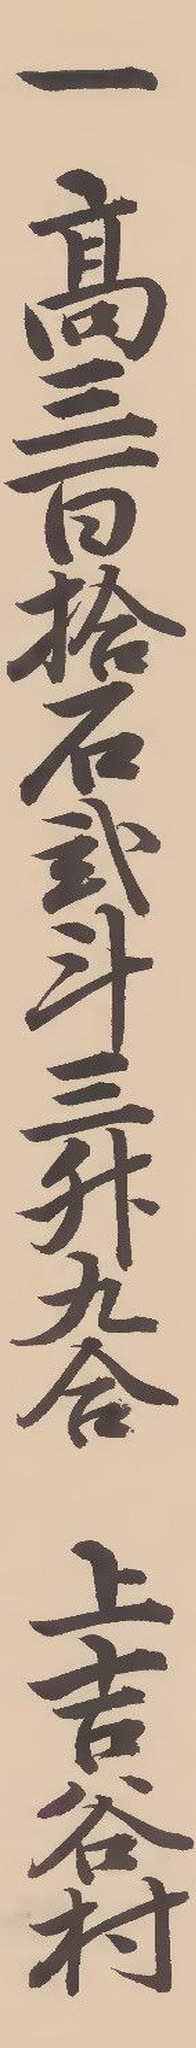一高三百拾石弐斗三升九合上吉谷村
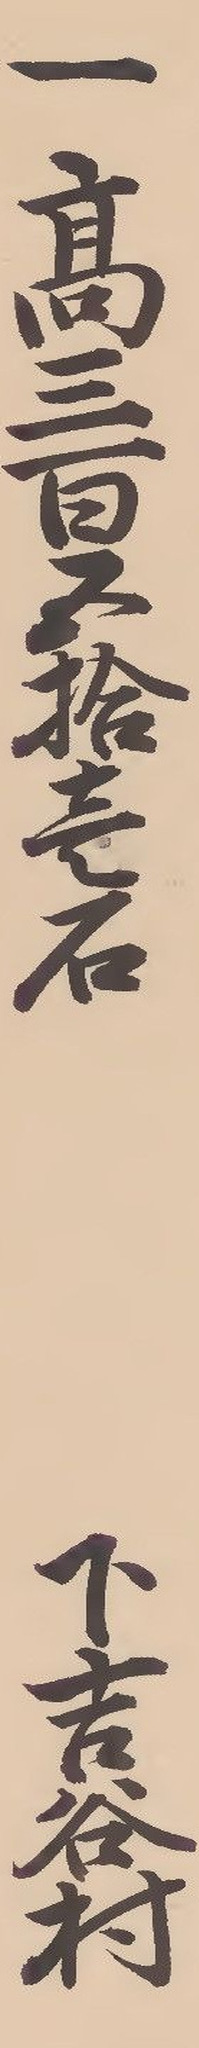一高三百五拾壱石下吉谷村

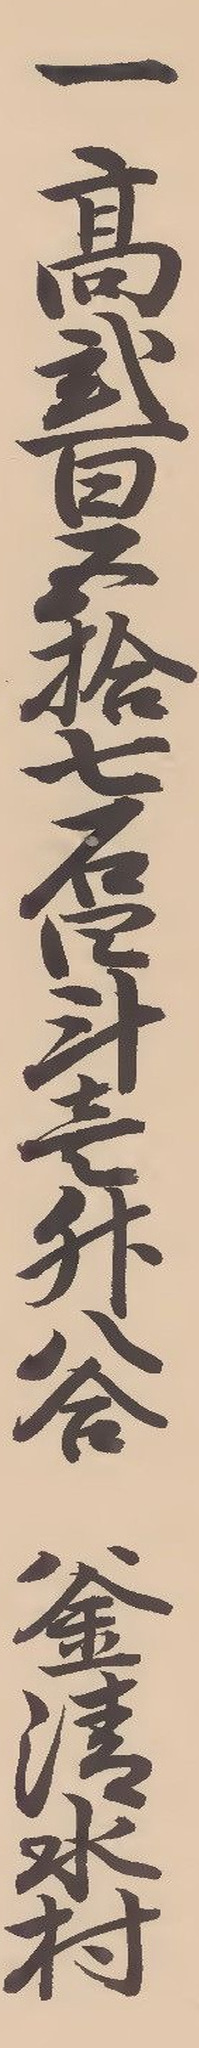一高弐百五拾七石四斗壱升八合釜清水村
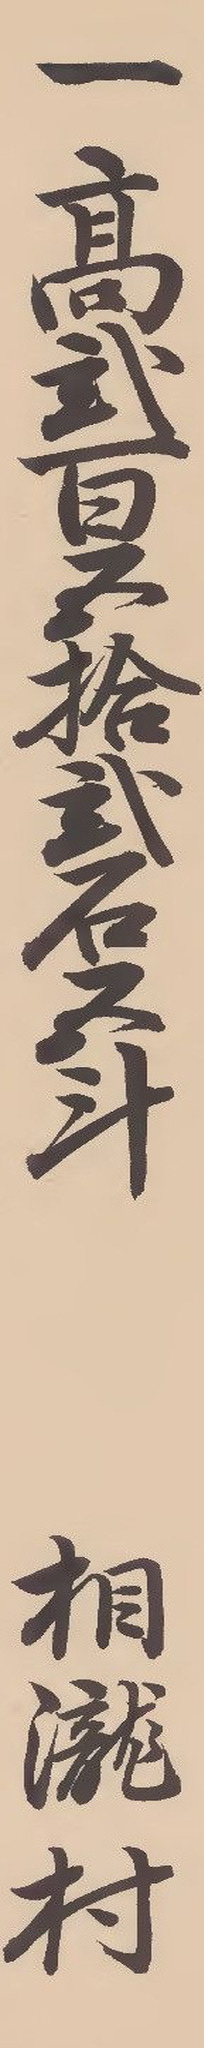一高弐百五拾弐石五斗相滝村
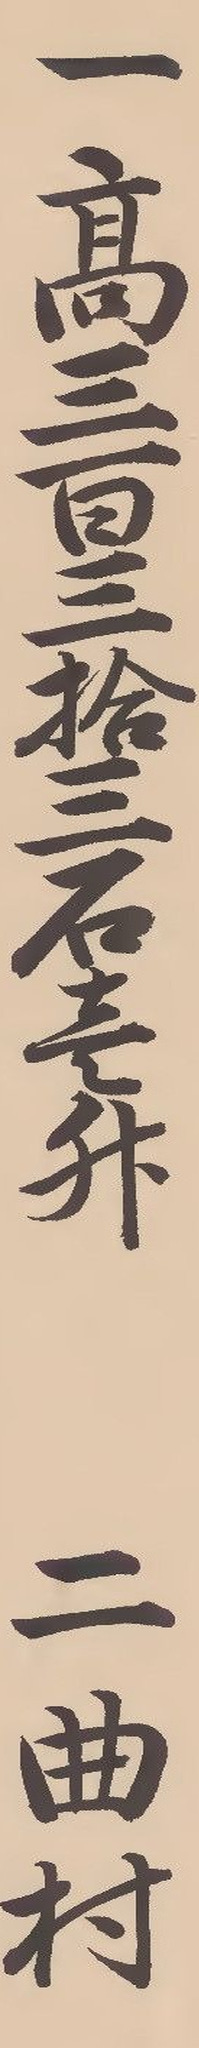一高三百三拾三石壱升二曲村
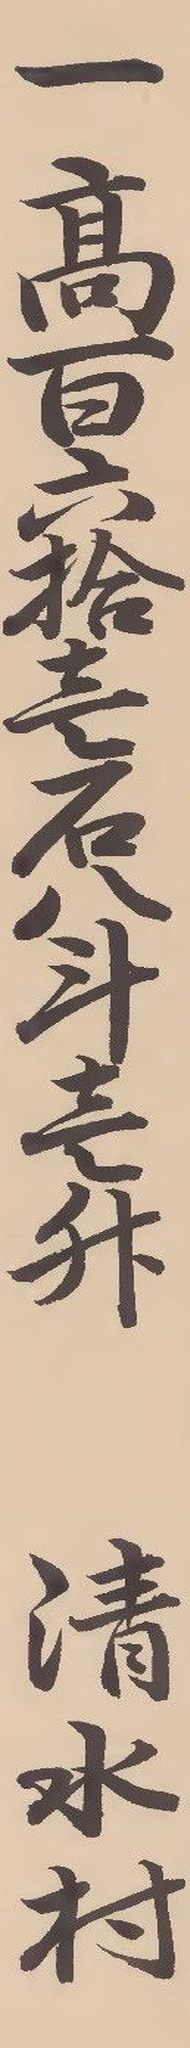一高百六拾壱石八斗壱升清水村
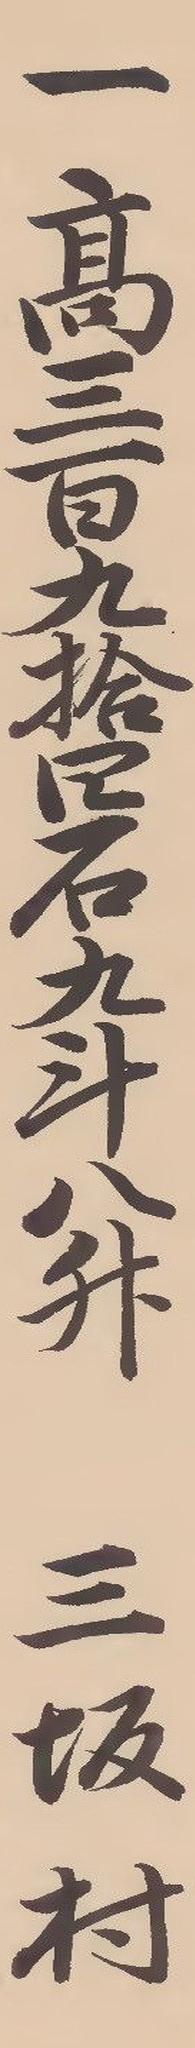一高三百九拾四石九斗八升三坂村
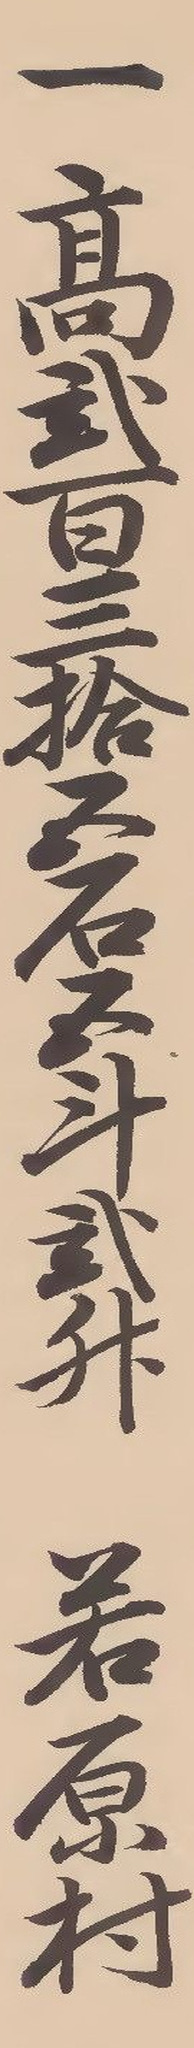一高弐百三拾五石五斗弐升若原村
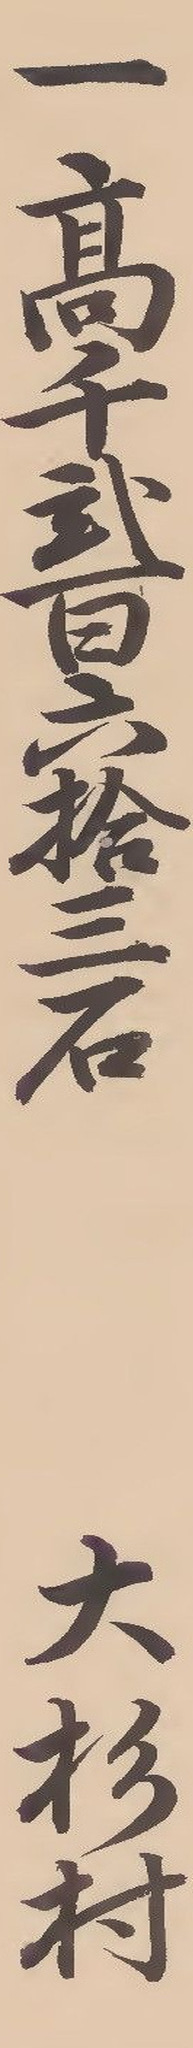一高千弐百六拾三石大杉村
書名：加賀国郷帳
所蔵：国立公文書館 National Archives of Japan
